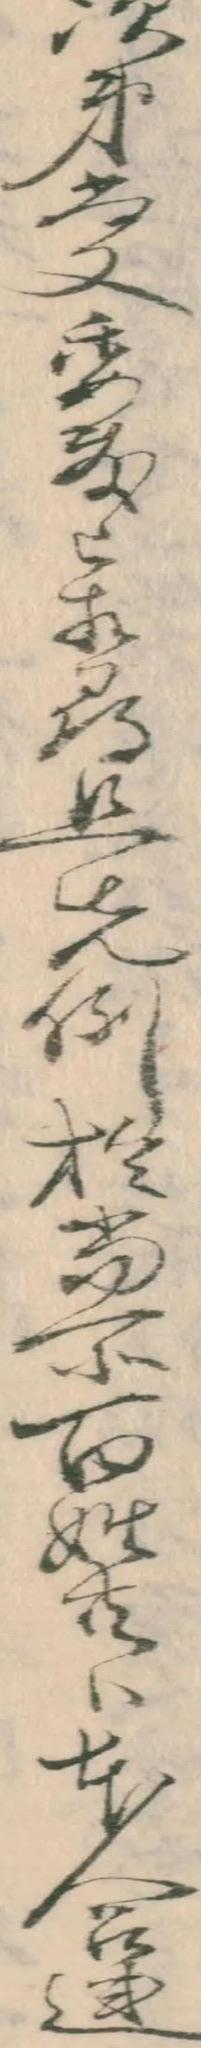次第尚又委敷被相尋且先例於當所百姓共ハ本人召連
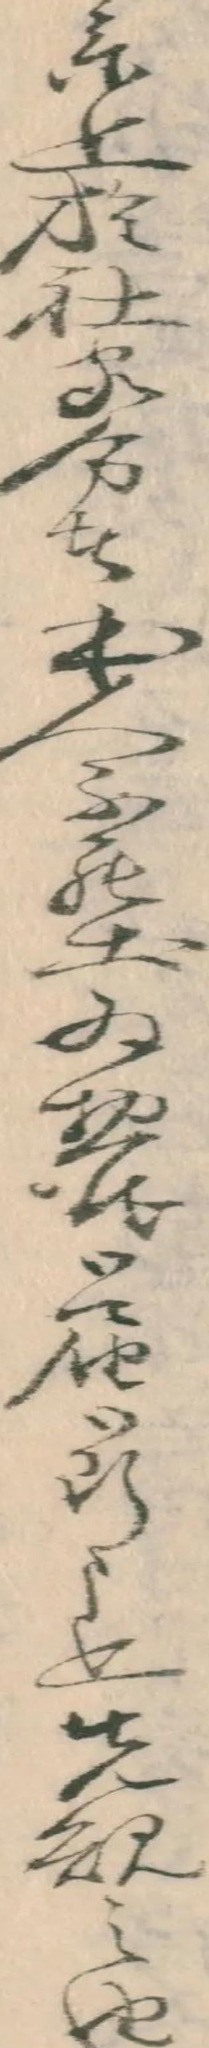参上於社家分は本人不罷出為惣代御届御断申上先規之由
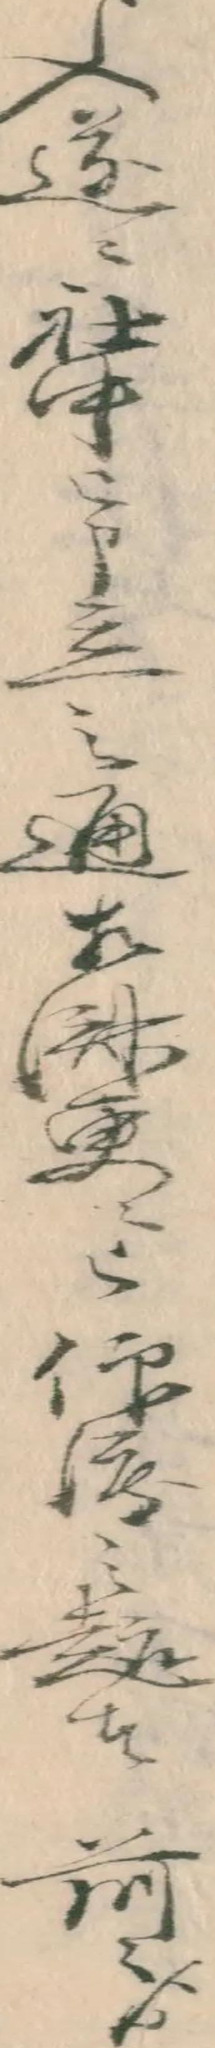申入遂ニ社中被申立之通相済更ニ被仰渡之趣は前々ゟ
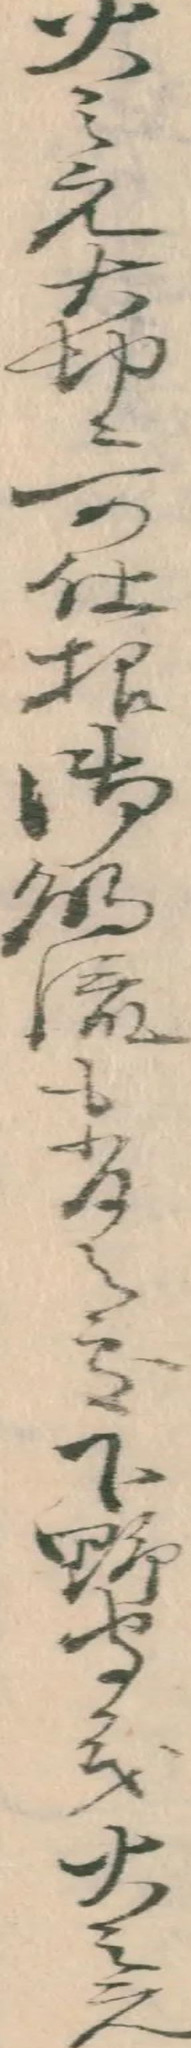火之元大切二可仕様御触流も有之處下野守義火之元
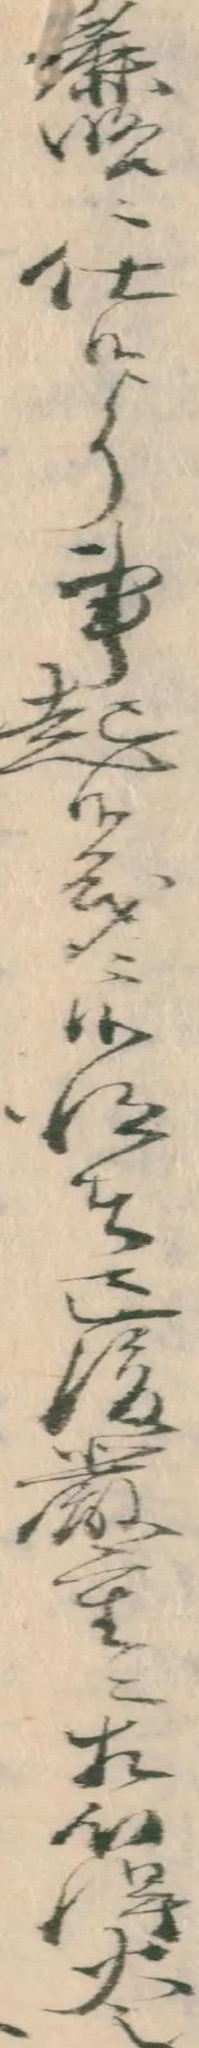晩二仕候より事起候義ニ候得共已後厳重に相心得火之
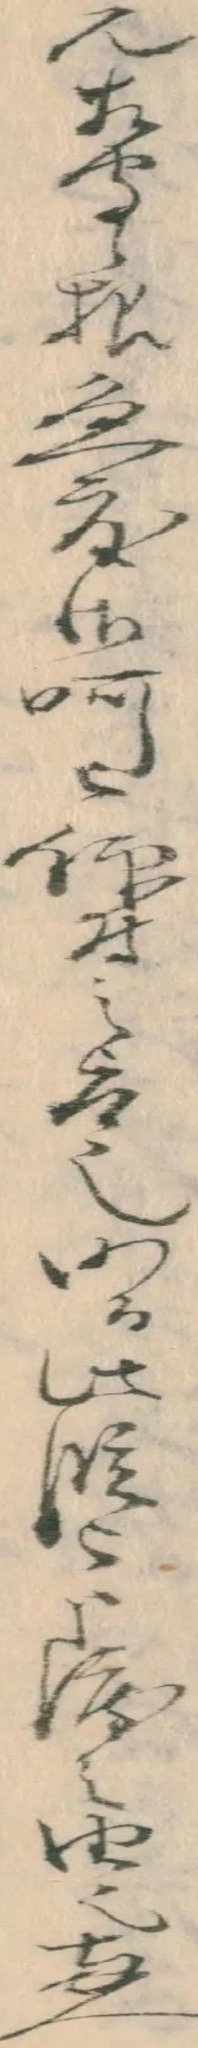元相守候様急度御呵被仰付之旨也仍而此段被申渡之由也両人
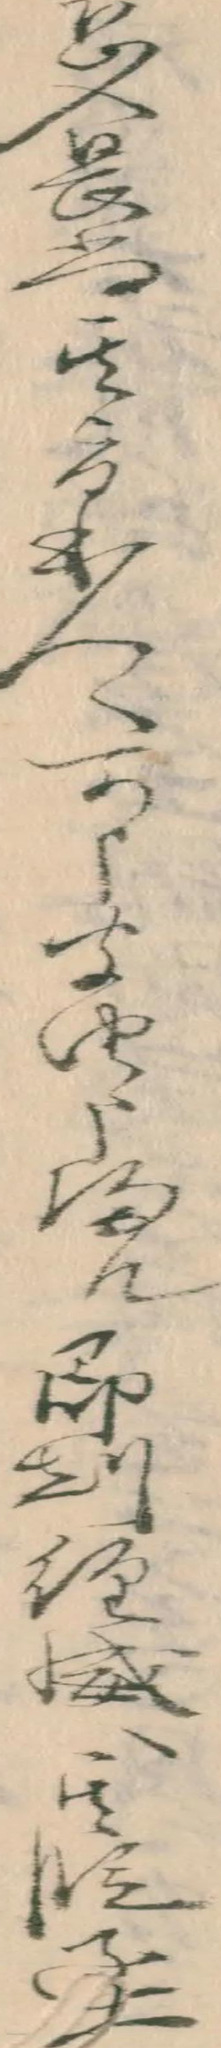恐入畏尚其旨本人へ可申聞由申帰ル即刻経威へ其段
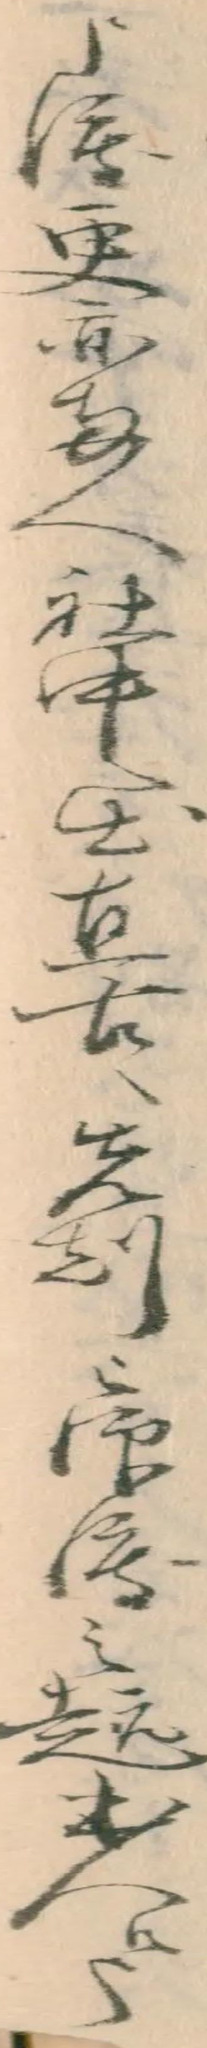申渡更亦両人社中へ出直古へ先刻被仰渡之趣本人え申
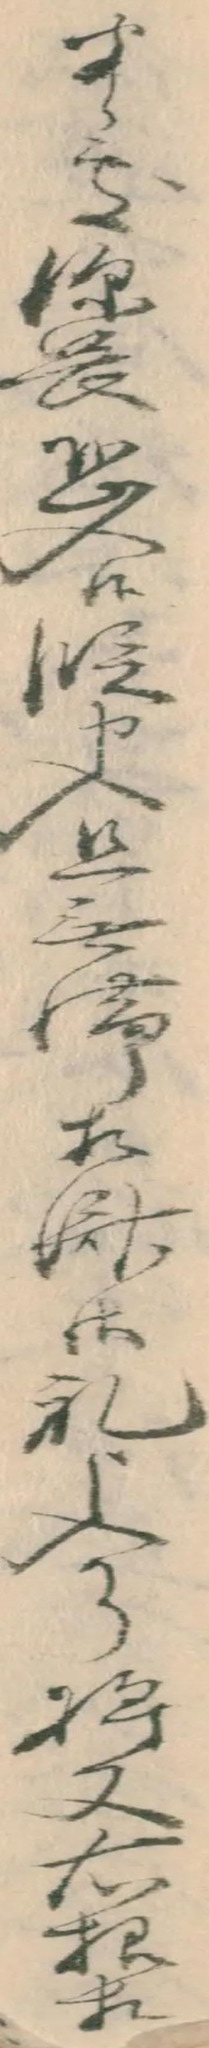聞候處深長恐入候段申入且無滞相済御礼申入了将又右様相
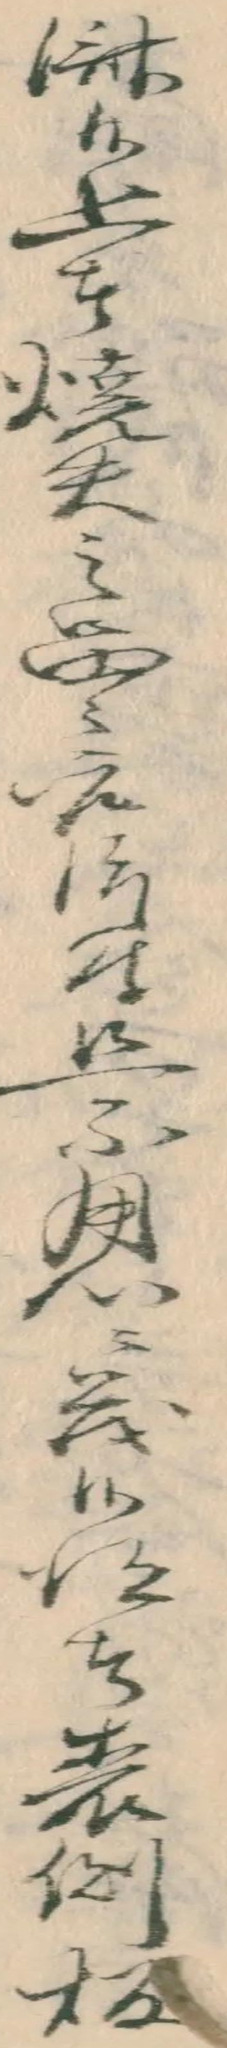済候上は焼失之品々取片付且不用心ニも候得は等不例板
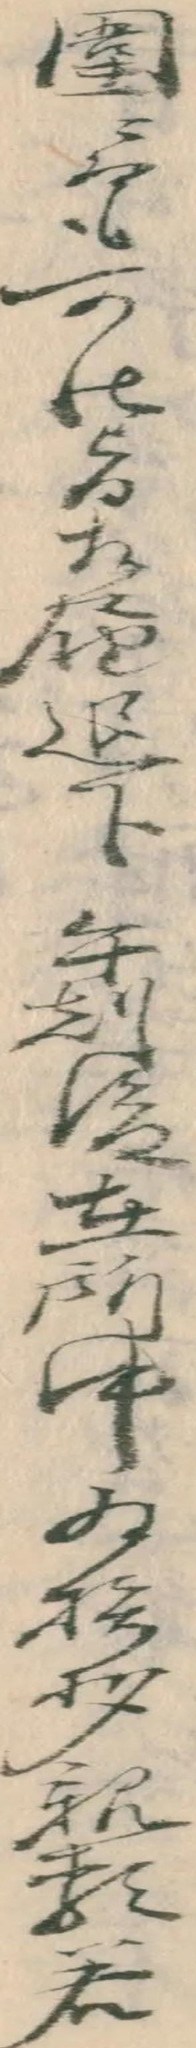圍二而も可仕旨相届退下午刻後在所中為挨拶親類若
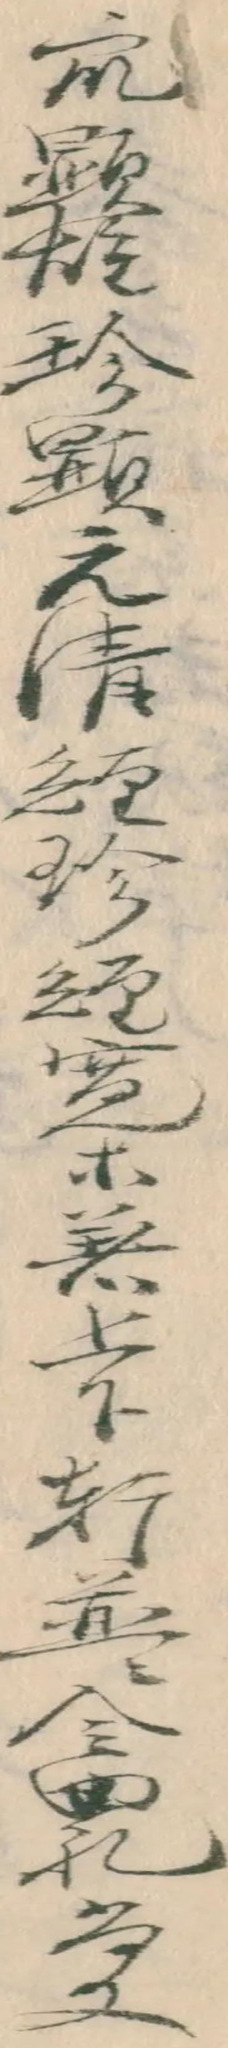衆顕雄珍顕元清経珍経寛等着上下軒並に令回礼尚又
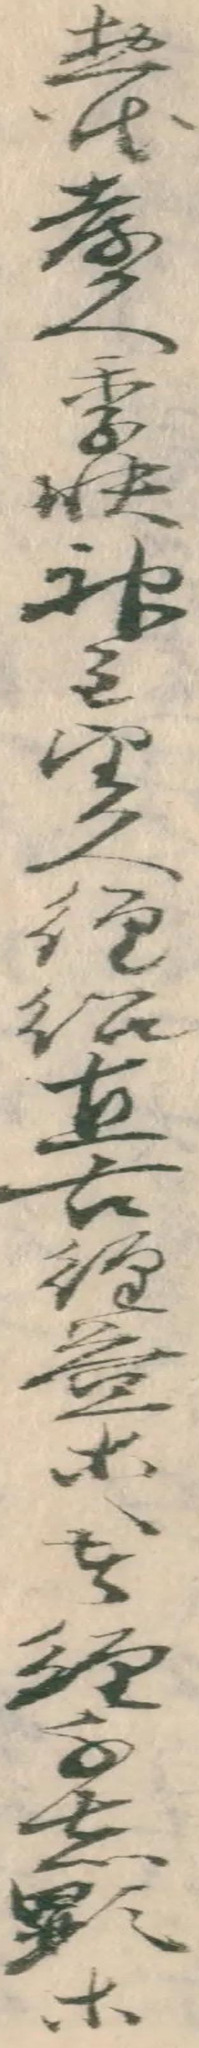惣代孝久季快神主望久経招結直古経益等へは経千志顕等
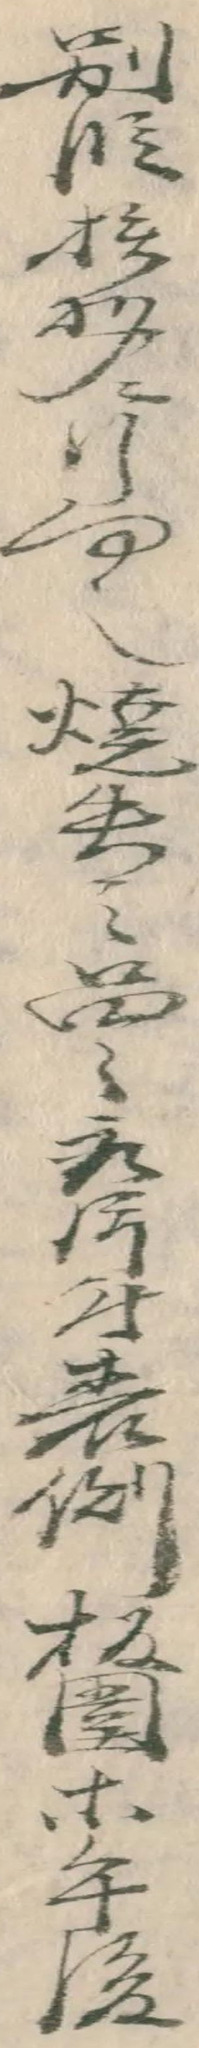別段挨拶に引向也焼失之品々取片付表側板圍等午後
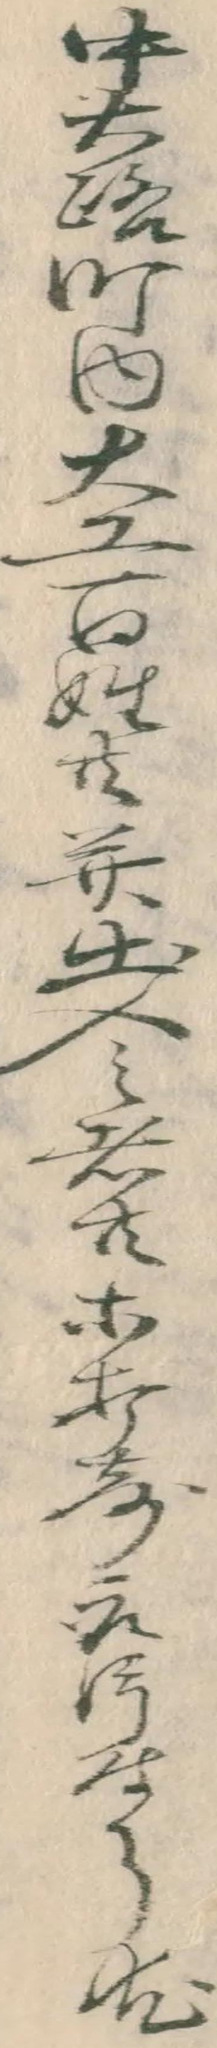中大路町内大工百姓共并出入之者共等打寄取片付了尤
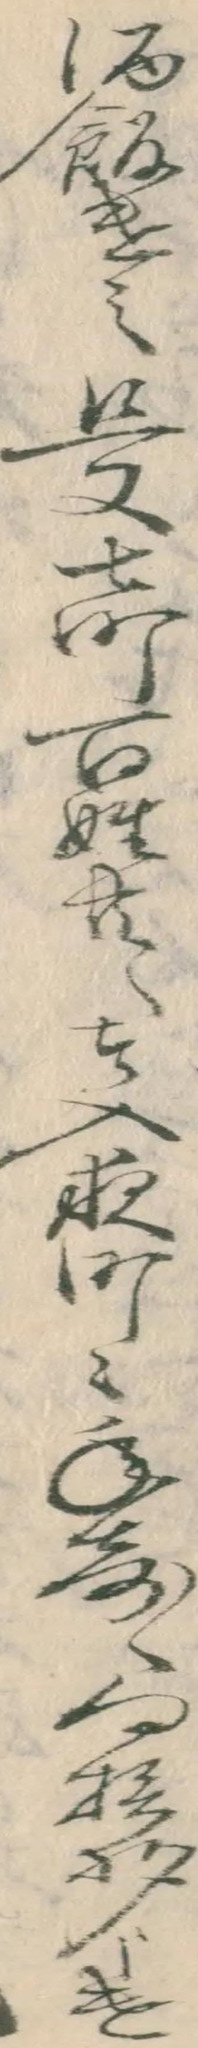酒飯遣之且又七町百姓共へは入夜町々年寄へ向挨拶申遣
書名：賀茂社記録. 第66冊
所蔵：国立国会図書館 National Diet Library, JAPAN
